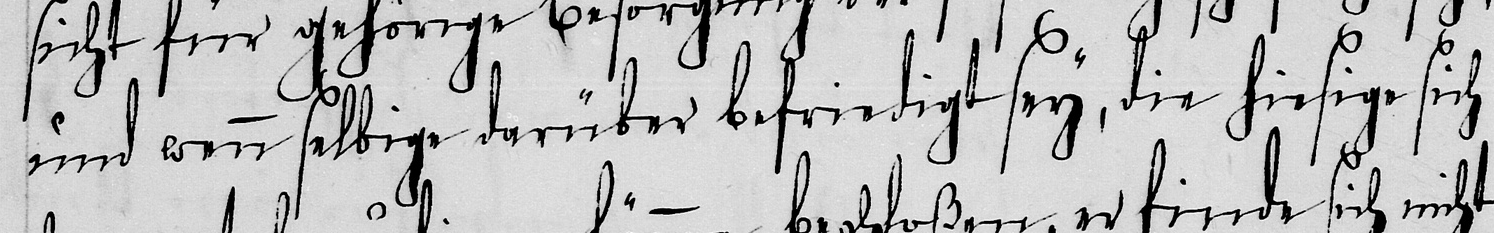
und wenn selbige darüber befriedigt sey, die hiesige sich
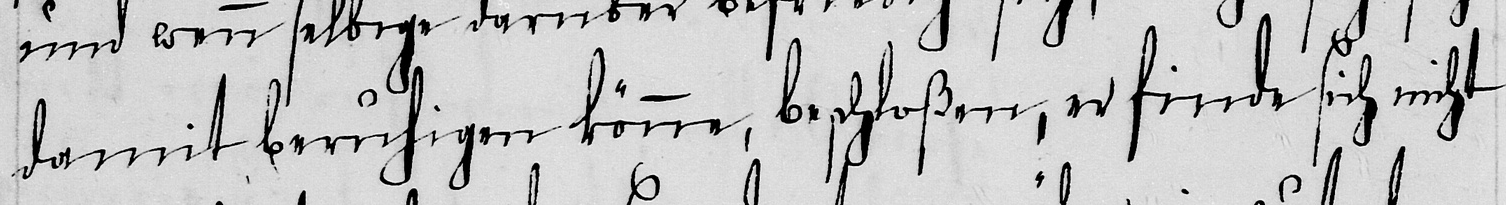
damit beruhigen könne, beschloßen, er finde sich nicht
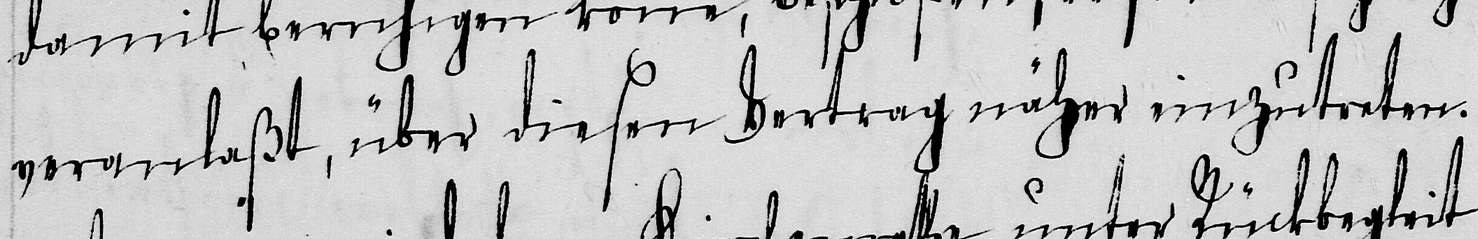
veranlaßt, über diesen Vertrag näher einzutreten.
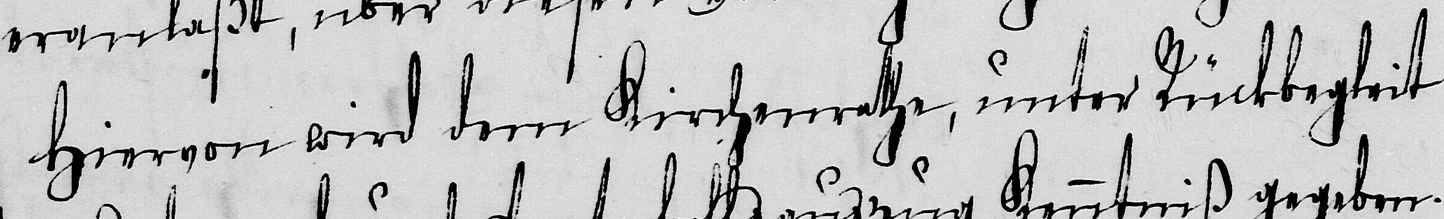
Hiervon wird dem Kirchenrathe, unter Rückbegleit
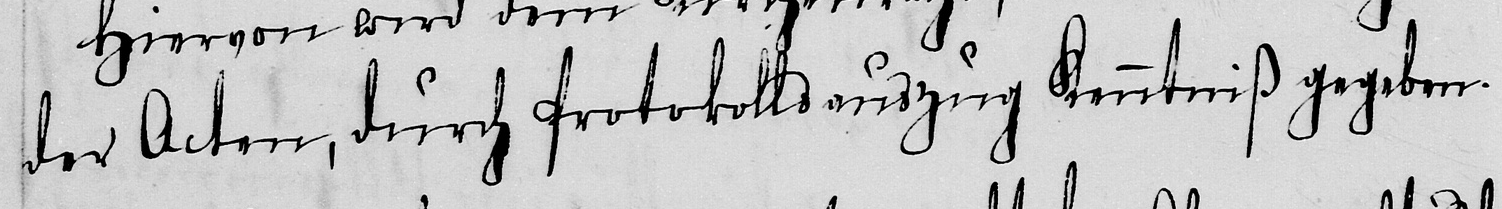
der Acten, durch Protokollsauszug Kenntniß gegeben.
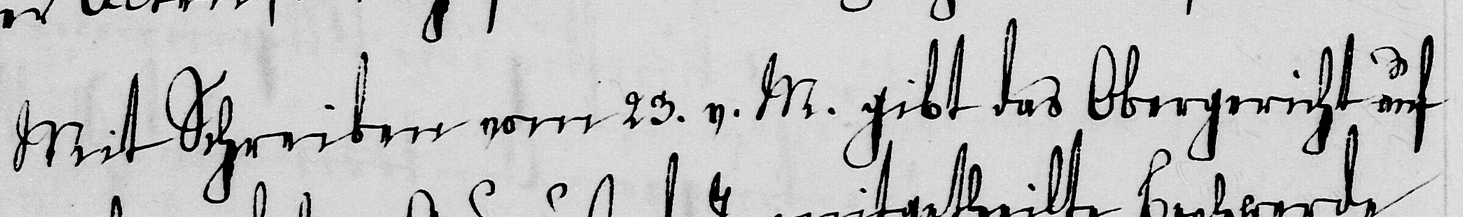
Mit Schreiben vom 23. v. M. gibt das Obergericht auf
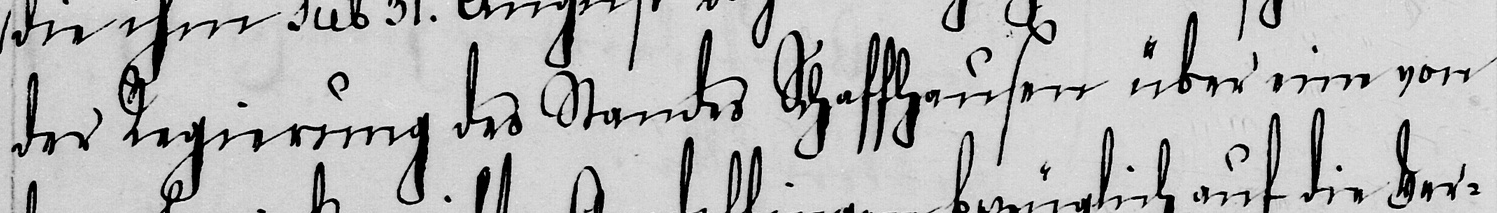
der Regierung des Standes Schaffhausen über eine von
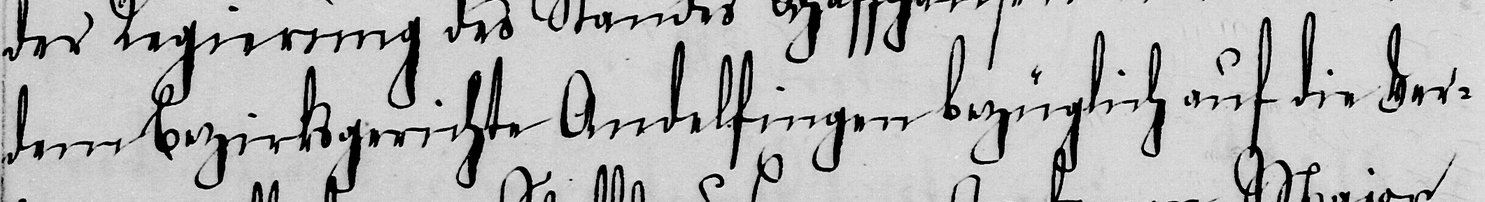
dem Bezirksgerichte Andelfingen bezüglich auf die Ver¬
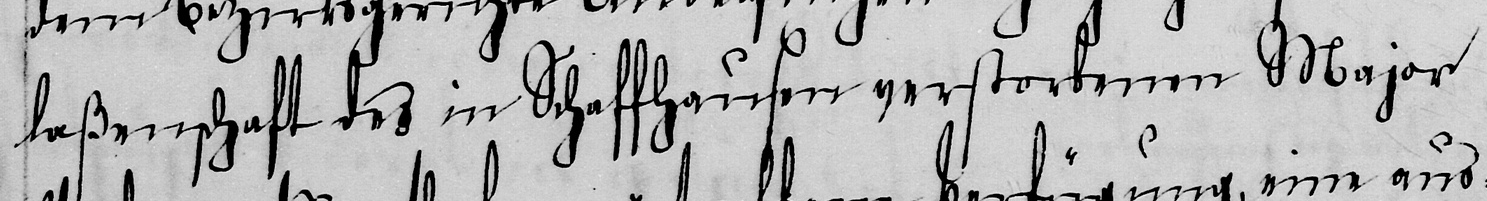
laßenschaft des in Schaffhausen verstorbenen Major
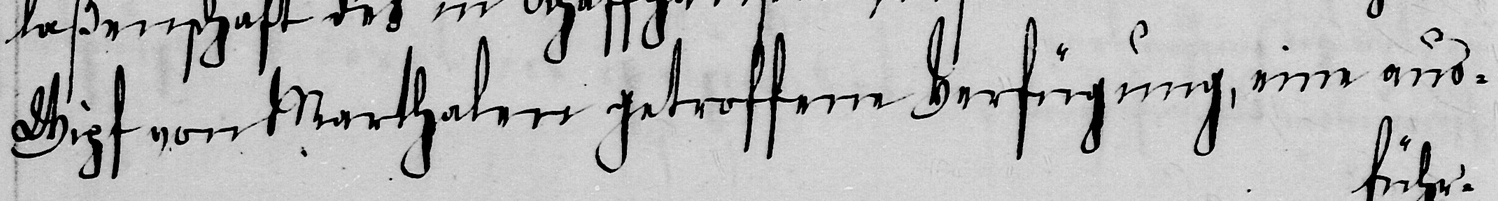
Wipf von Marthalen getroffene Verfügung, eine aus-
